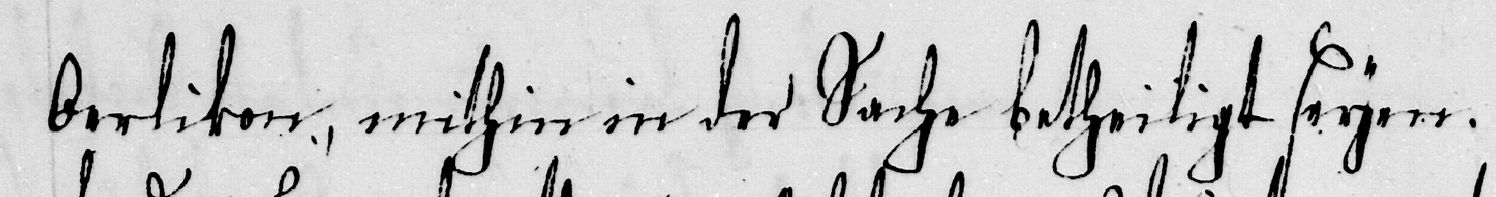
Oerlikon, mithin in der Sache betheiligt seyen.
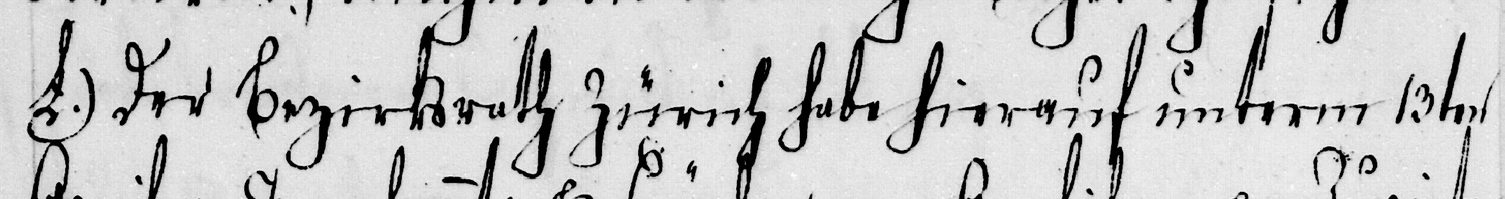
L.) Der Bezirksrath Zürich habe hierauf unterm 13ten
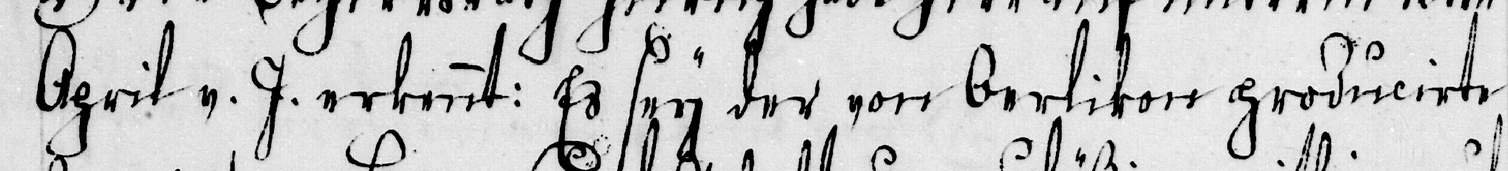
April v. J. erkannt: Es sey der von Oerlikon producirte
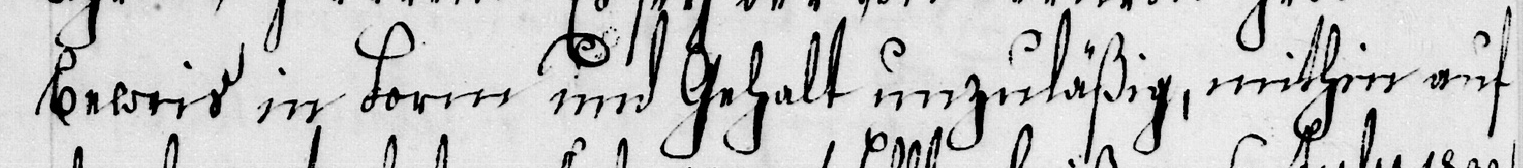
Beweis in Form und Gehalt unzuläßig, mithin auf
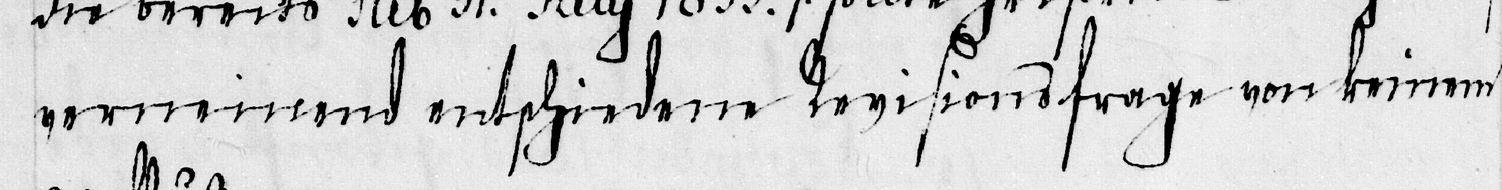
verneinend entschiedene Revisionsfrage von keinem
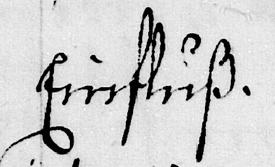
Einfluß.
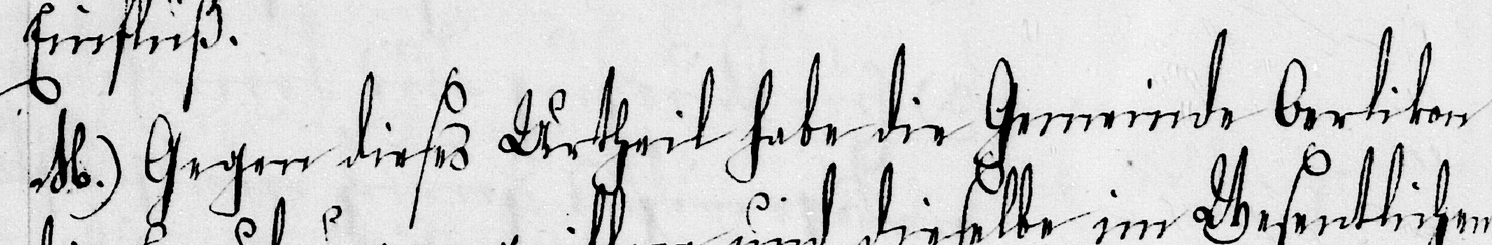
M.) Gegen dieses Urtheil habe die Gemeinde Oerlikon
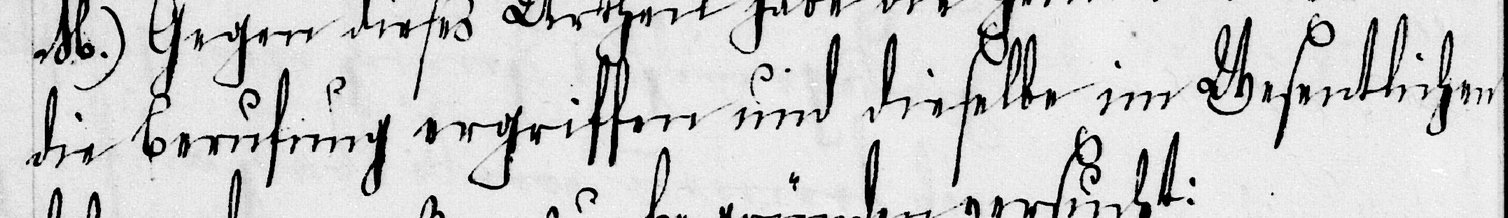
die Berufung ergriffen und dieselbe im Wesentlich¬
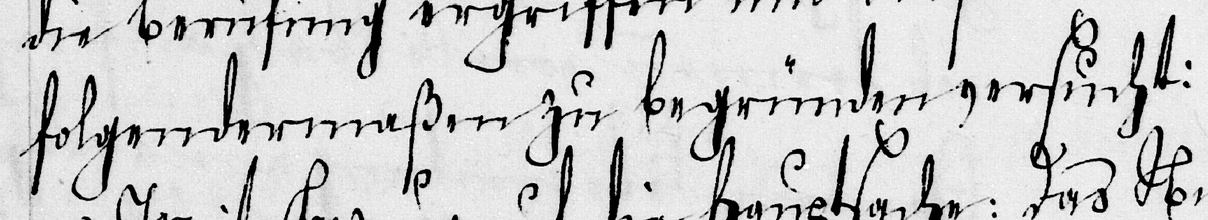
folgendermaßen zu begründen versucht:
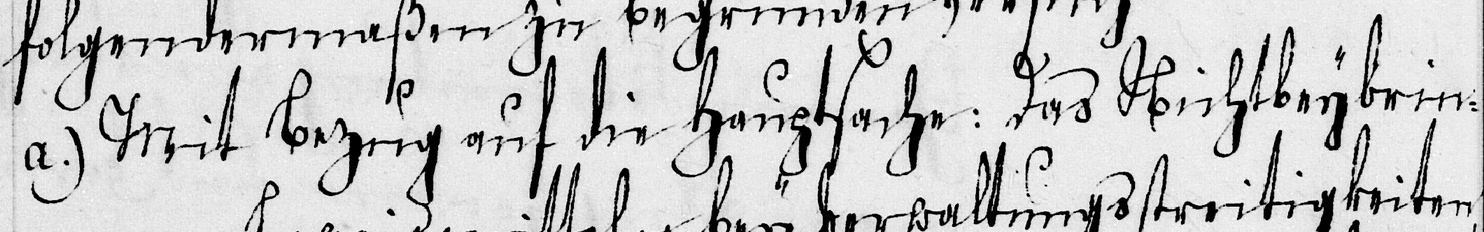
a.) Mit Bezug auf die Hauptsache: Das Nichtbeybrin¬
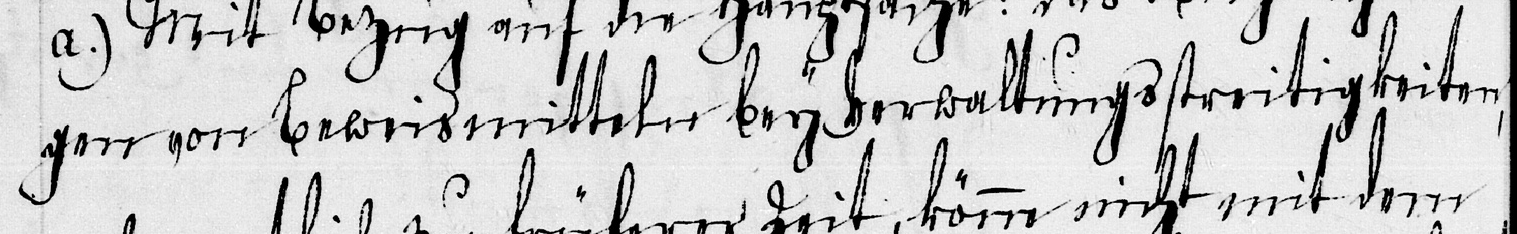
gen von Beweismitteln bey Verwaltungsstreitigkeiten,
